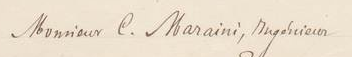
Monsieur C. Maraini, Ingénieur
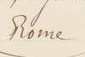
Rome
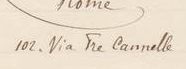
102. Via Tre Cannelle
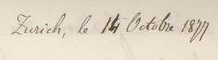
Zurich, le 14 Octobre 1877
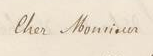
Cher Monsieur
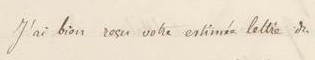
J'ai bien reçu votre estimée lettre du
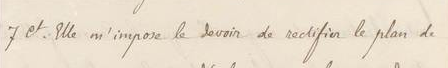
7 Ct. Elle m'impose le devoir de rectifier le plan de
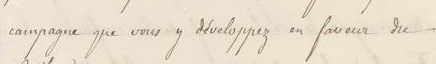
campagne que vous y développez en faveur du
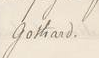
Gothard.
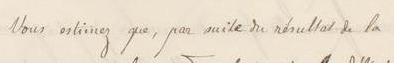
Vous estimez que, par suite du résultat de la
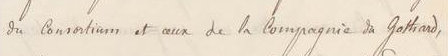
du Consortium et ceux de la Compagnie du Gothard,
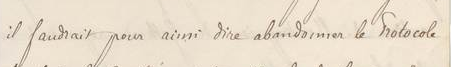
il faudrait pour ainsi dire abandonner le Protocole
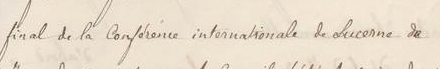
final de la Conférence internationale de Lucerne du
